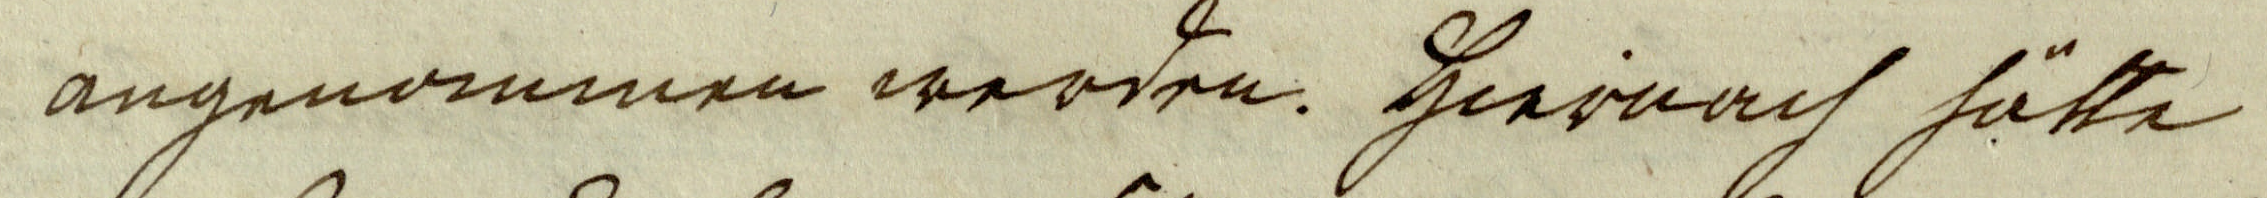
angenommen werden. Hiernach hätte
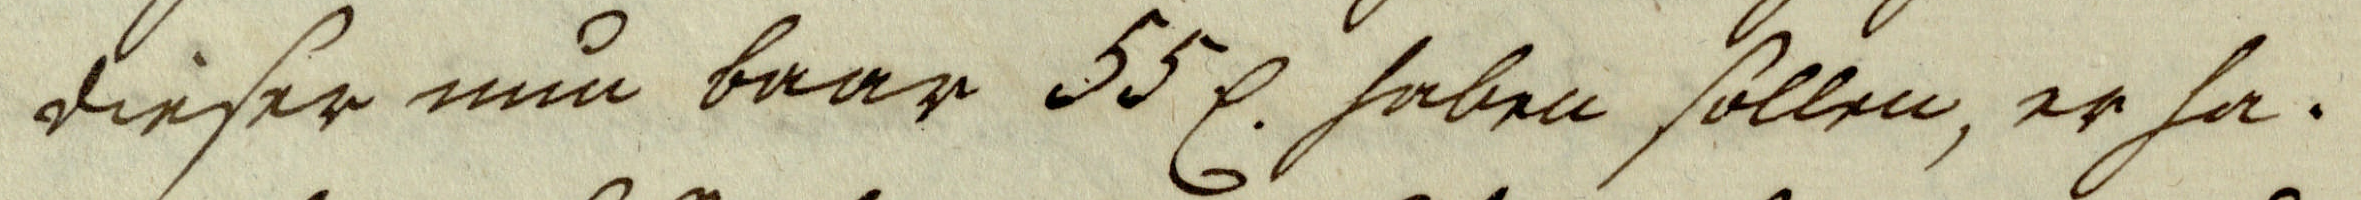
dieser nun baar 55 rtl. haben sollen, er ha¬
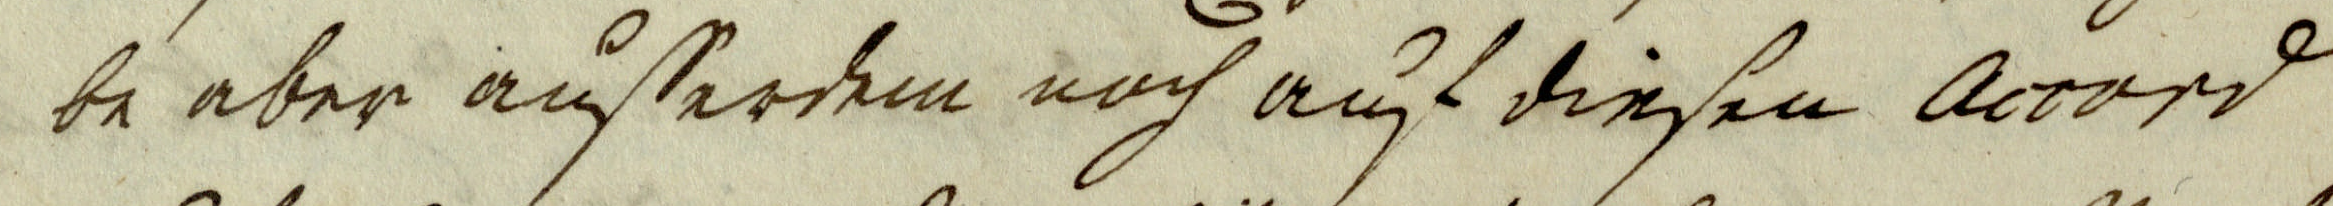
be aber ausserdem noch auf diesen Accord
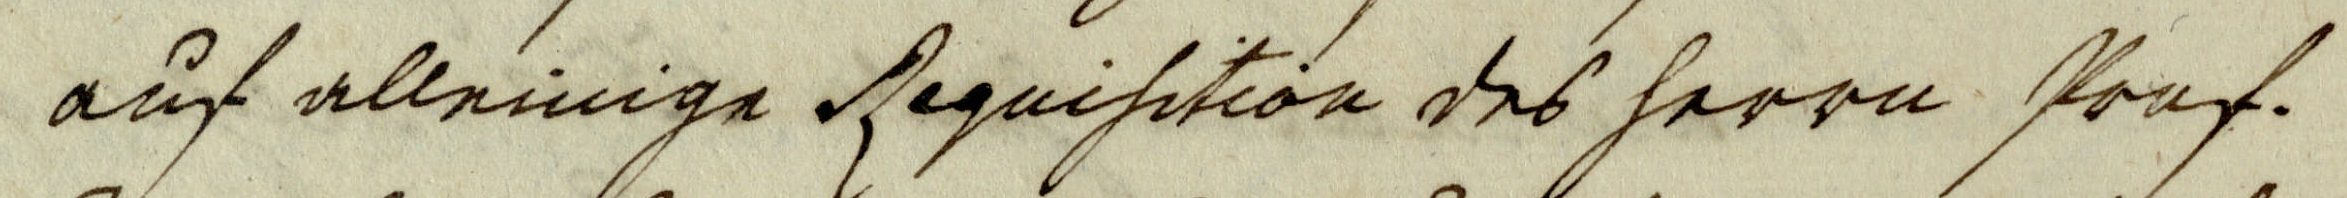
auf alleinige Requisition des Herrn Prof.
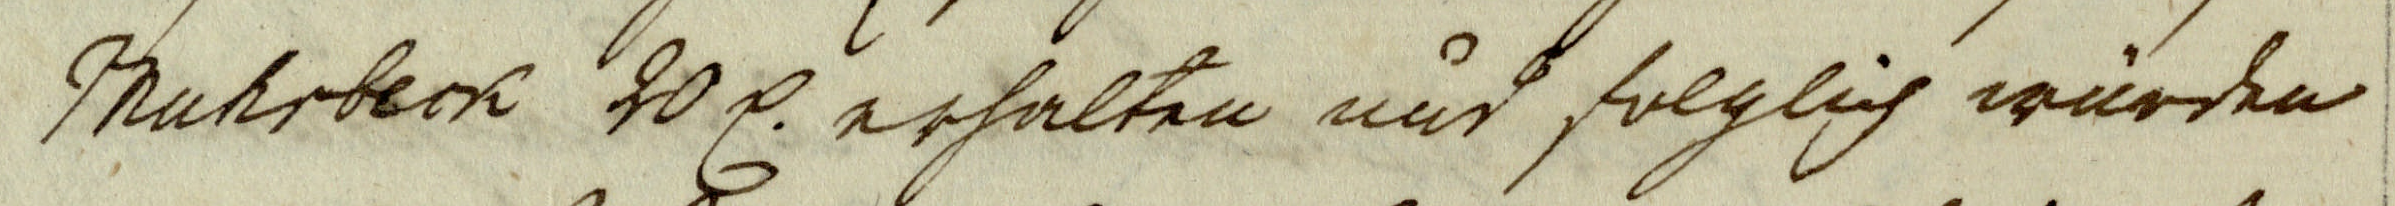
Muhrbeck 20 rtl. erhalten und folglich würden
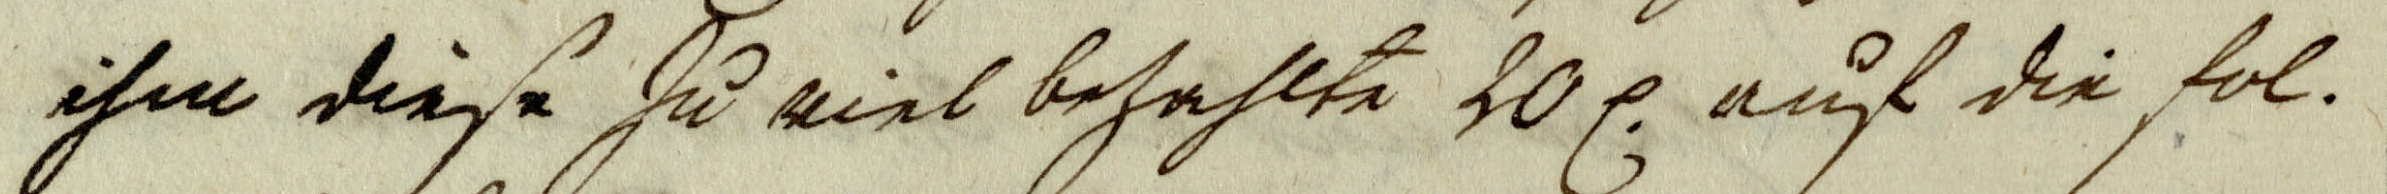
ihm diese zu viel bezahlte 20 rtl. auf die fol¬
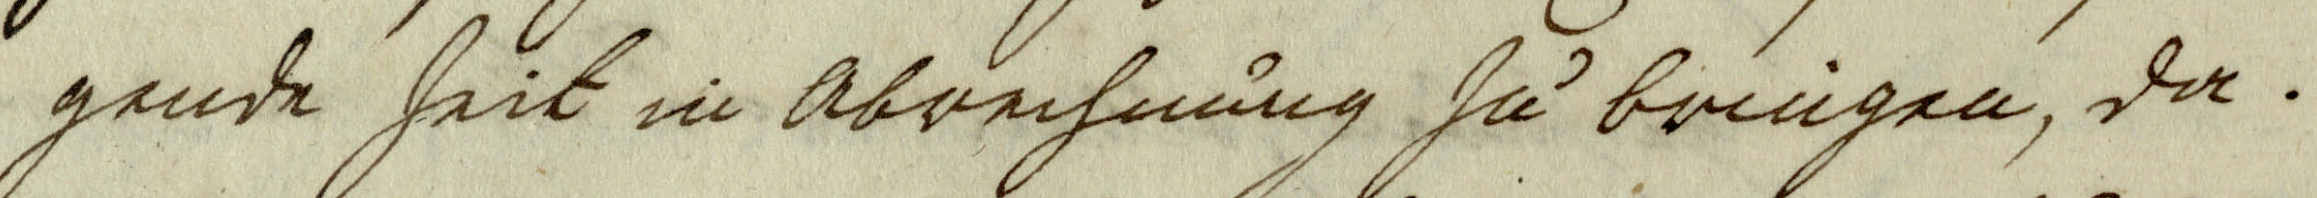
gende Zeit in Abrechnung zu bringen, da¬
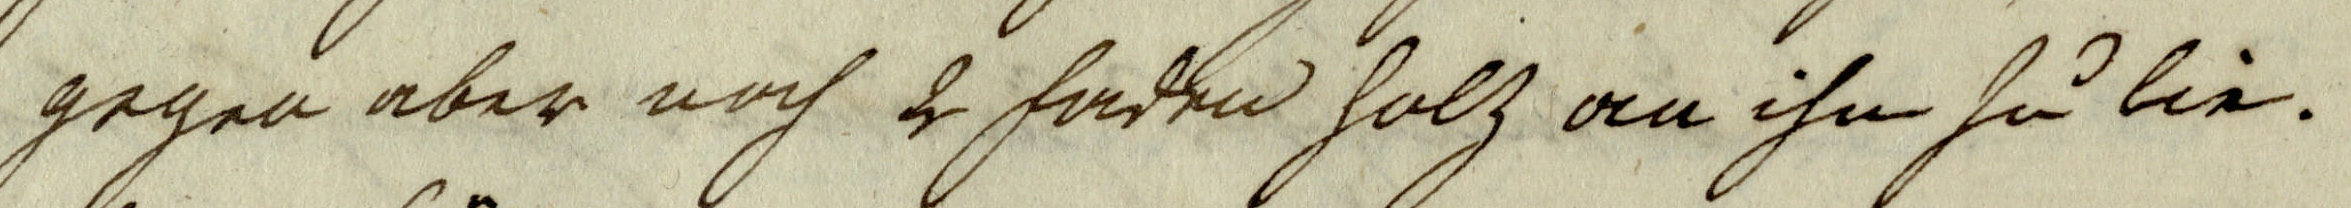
gegen aber noch 2 Faden Holz an ihn zu lie¬
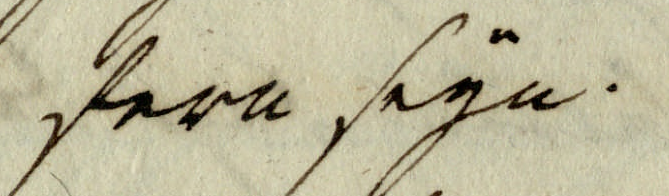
fern seÿn.
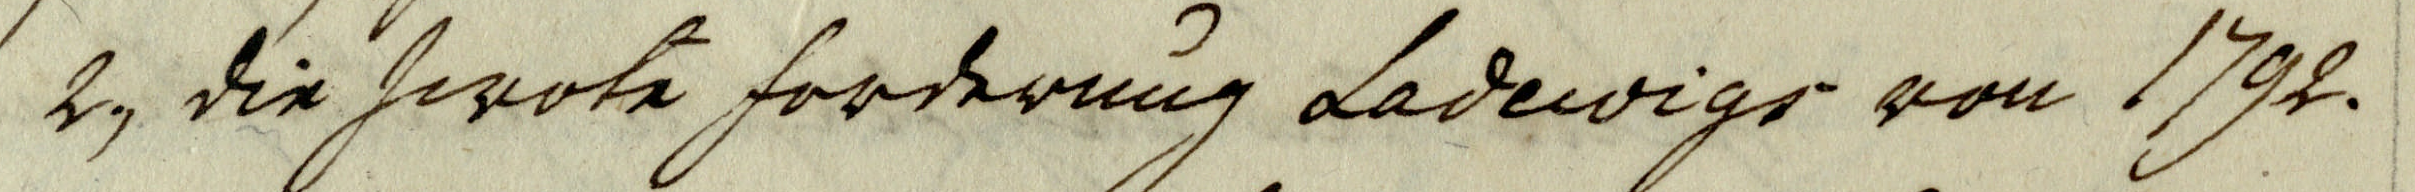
2., die zwote Forderung Ladewigs von 1792.
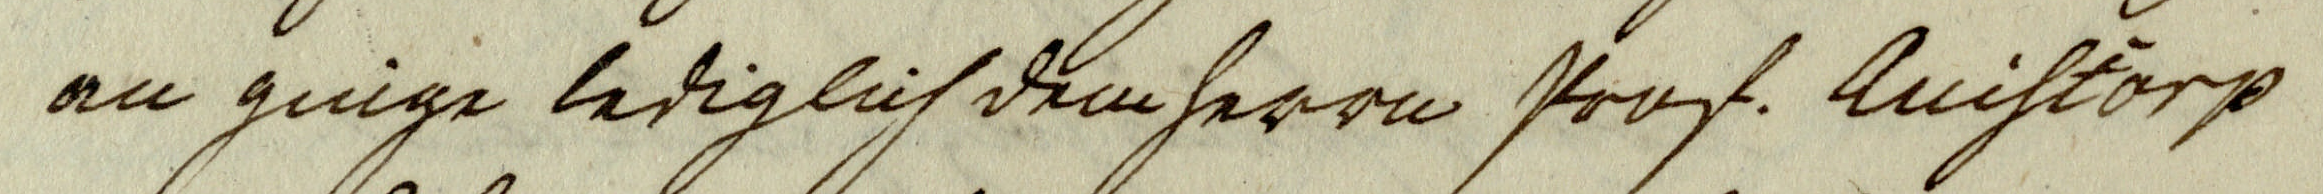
an ginge lediglich dem Herrn Prof. Quistorp
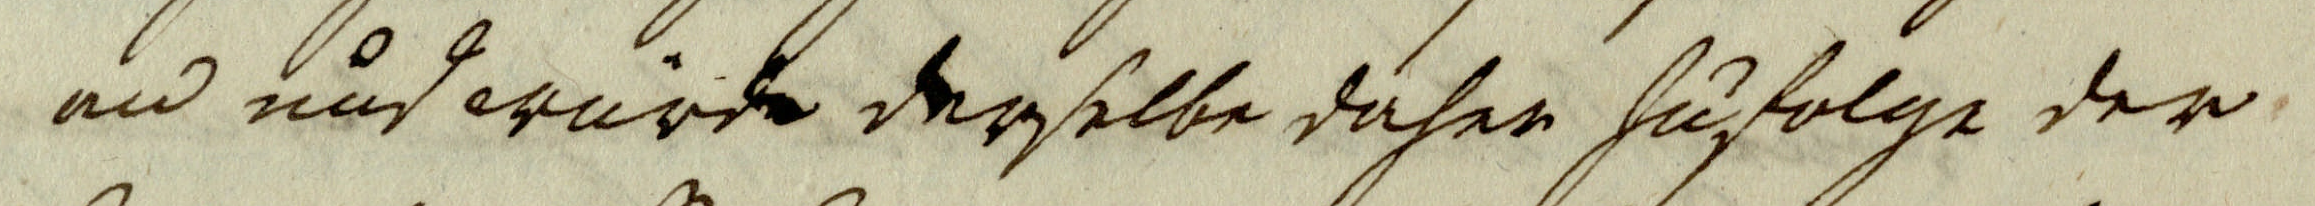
an und würde derselbe daher zufolge der
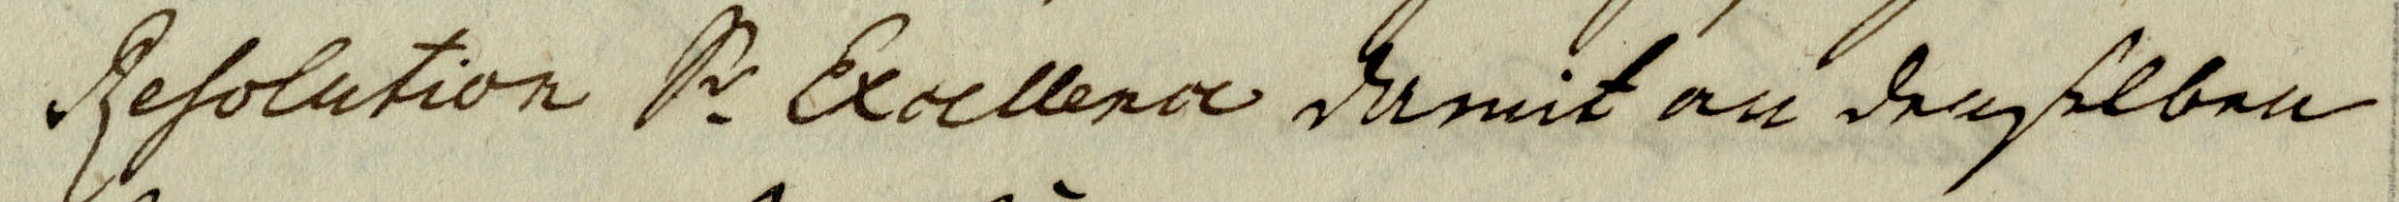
Resolution Sr. Excellence damit an denselben
